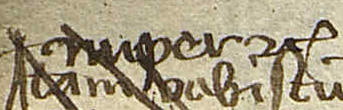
Nuper ec*
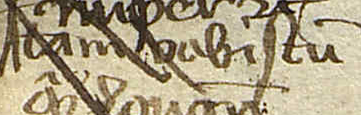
tam vobiſcu*
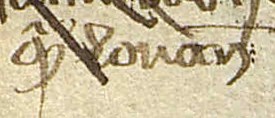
q* louan*
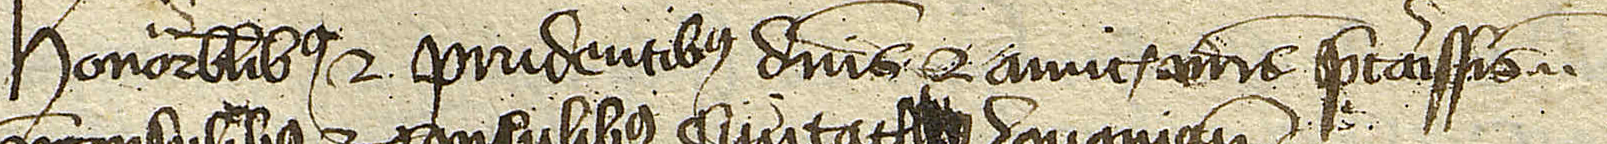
Honor*bilib* @ Prudentib* d*nis @ amic* n*s p*cariſſimis ~
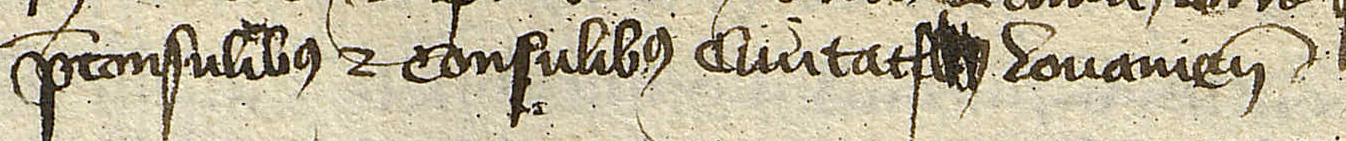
p*conſulib* @ Conſulib* Ciuitat*%% Louanien* /
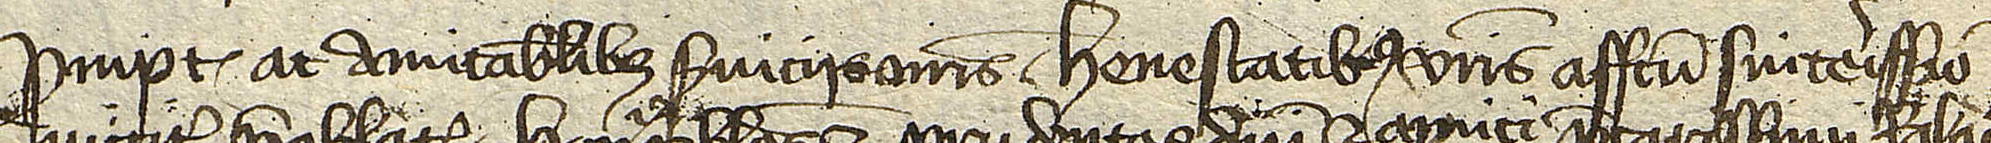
P*mpt* ac Amicab*lib* ſ*uiciis n*r*s honeſtatib* v*ris aff*c*u* ſinc*iſſimu*
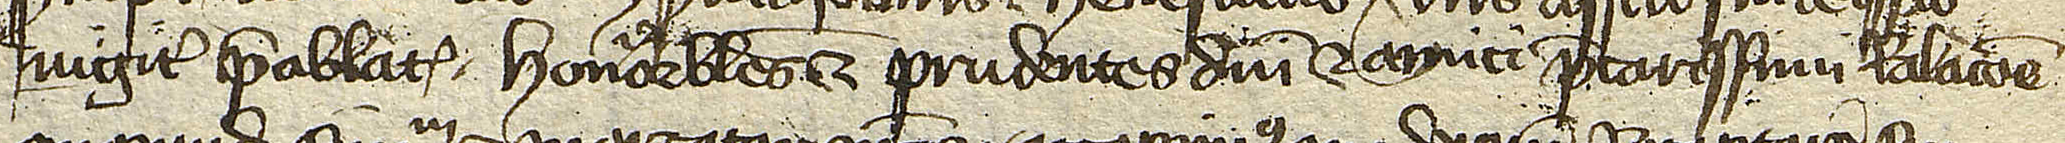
Iugit* p*oblat* Honor*b*les @ prudentes d*m*i @ amici p*cariſſimi Rela*e
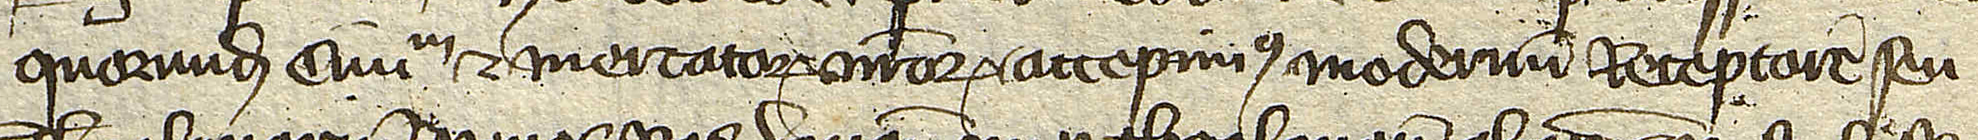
quorundem Ciu* @ mercato* n*ro* / accepim* modernu* Receptore* ſeu
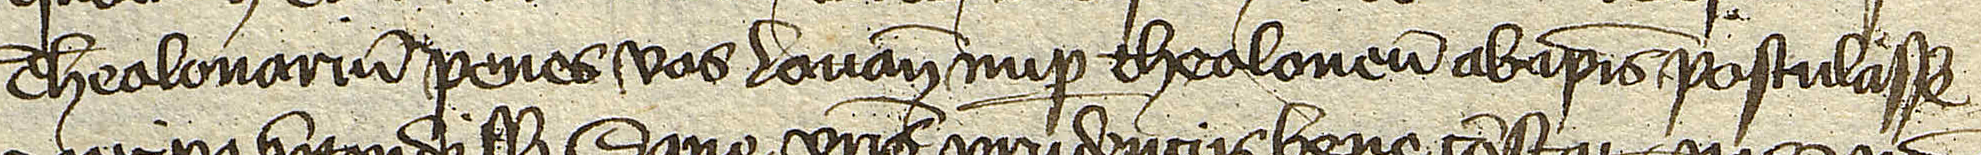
Theolonariu* penes vos Louan* nup* theolonen* ab ip*is poſtulaſſe
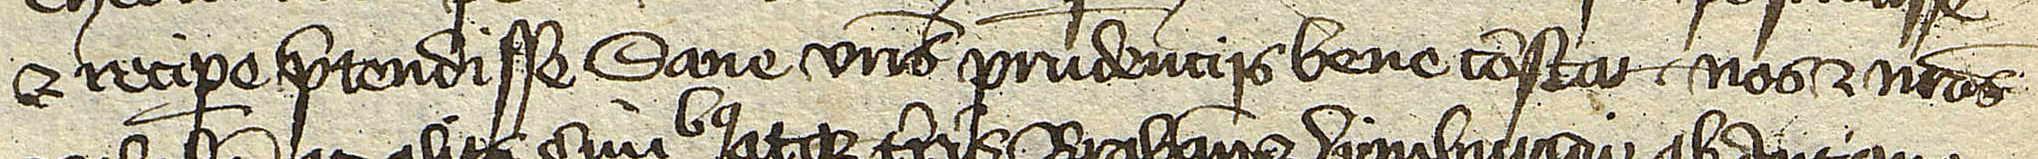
@ recip*e p*tendiſſe Sane v*ris prudentiis bene co*ſtat / nos @ n*ros
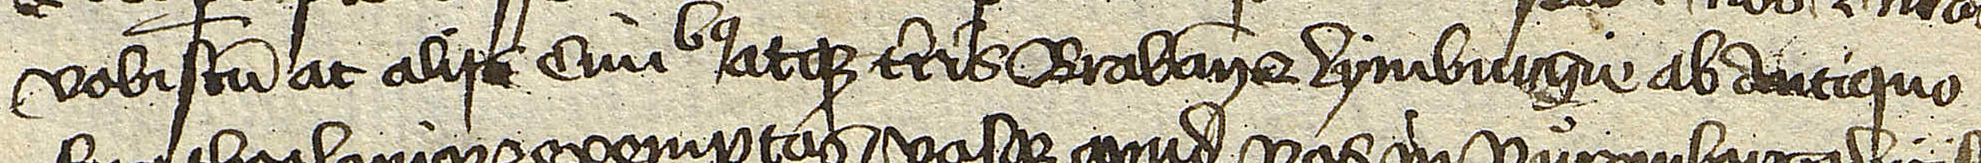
vobiſcu* ac aliis Ciuib* atq* t*ris Braban* @ Lymburgie ab Antiquo
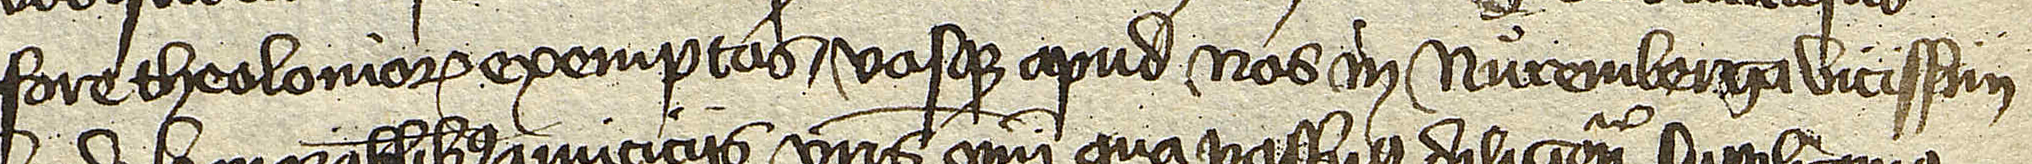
fore theolonio* exemptus vosq* apud nos in Nüremberga vitiſſim*
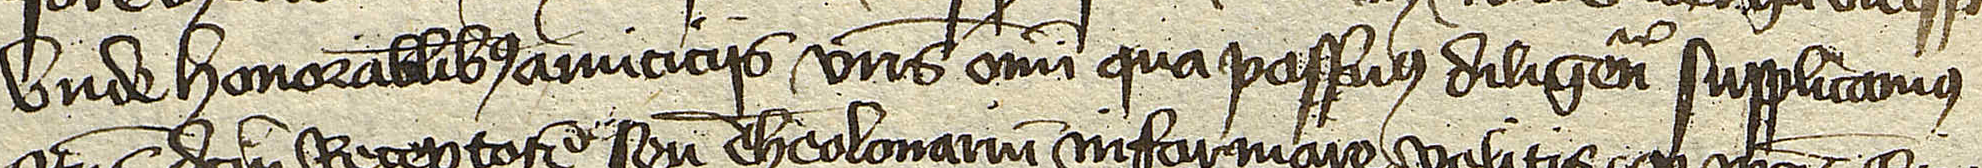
Vnde honorab*lib* amiciciis v*ris om*i quo poſſu* diligen* ſupplicam*
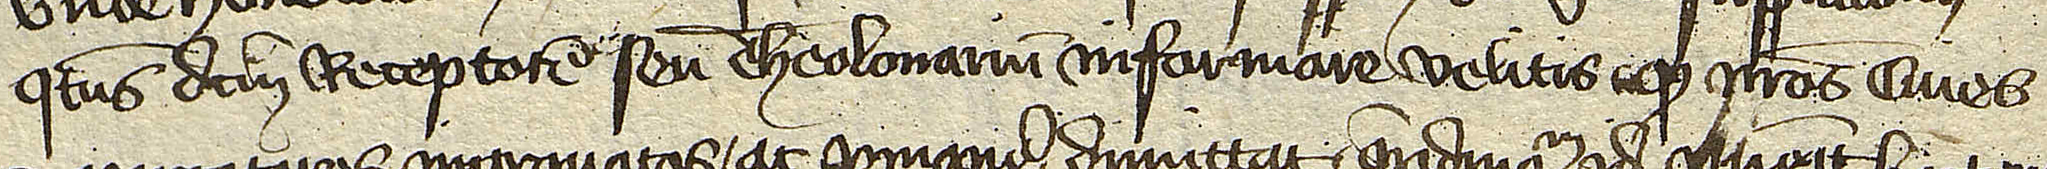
q*t*us d*c*m receptore* ſeu Theolonariu* informare velitis / p* n*ros Ciues
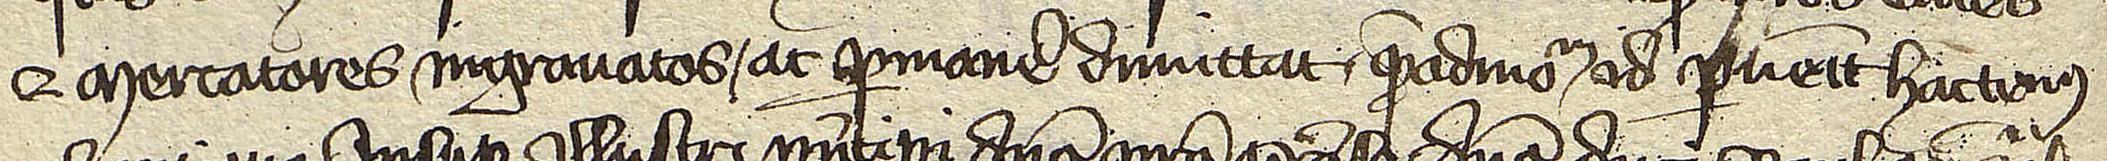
@ Mercatores ingrauatos / ac p*mane* dimittat / q*admo*m id p*ue*it hactenu*
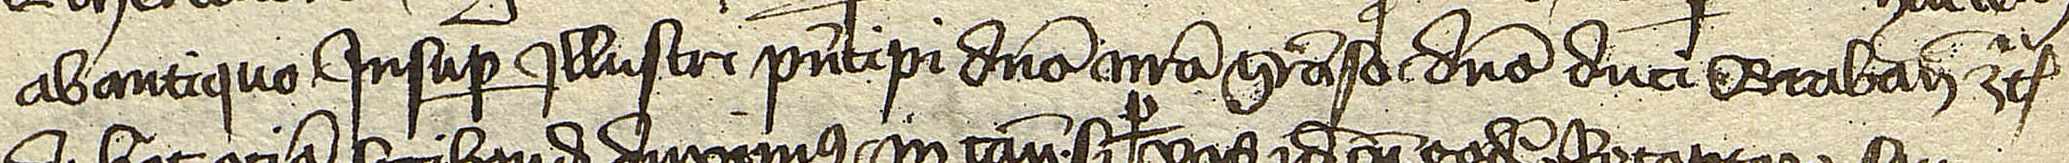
ab antiquo / Inſup* Illuſtri p*ncipi d*no n*ro g*r*oſo / d*no duci Braban* ec*
